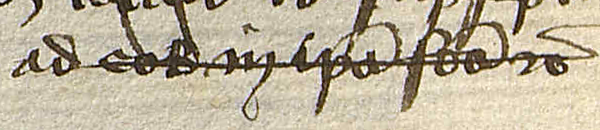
ad eos in ipa* ſca* ec*
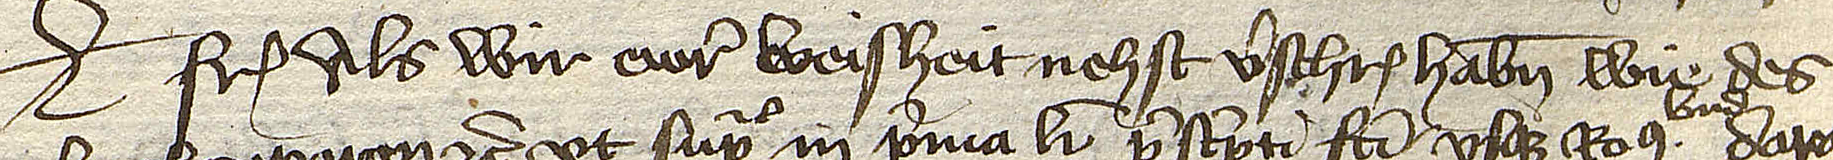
L* fr* Als wir ewr* weiſheit nehſt v*ſchr* habn* wie des
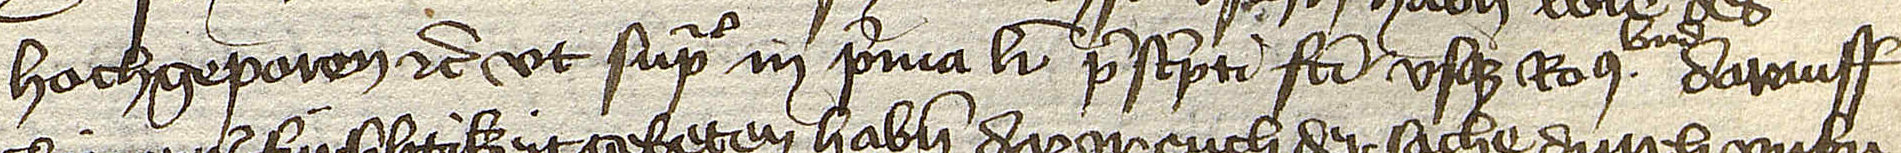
hochgeporen ec* vt ſup* in p*ma lr* p*ſc*pti fci* vſq* Ro* . darauff
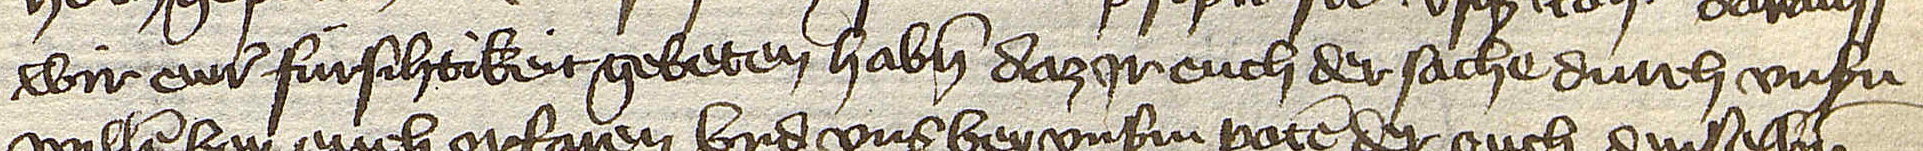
wir ewr* fürſihtikeit gebeten habn* daʒ Ir euch der ſache durch vnſ*n
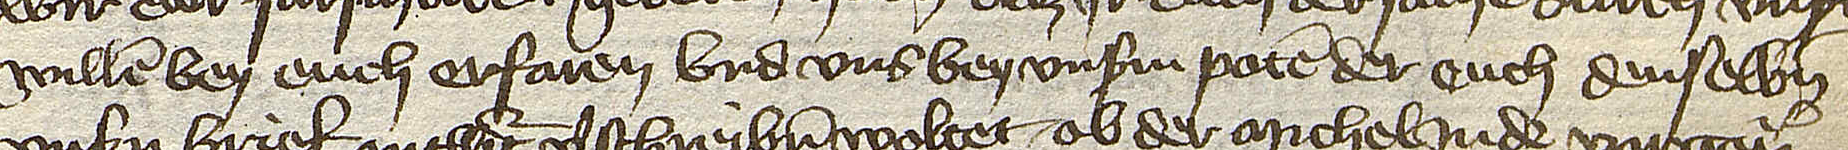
wille* bey euch erfaren vnd vns bey vnſ*m pote* der euch denſelbn*
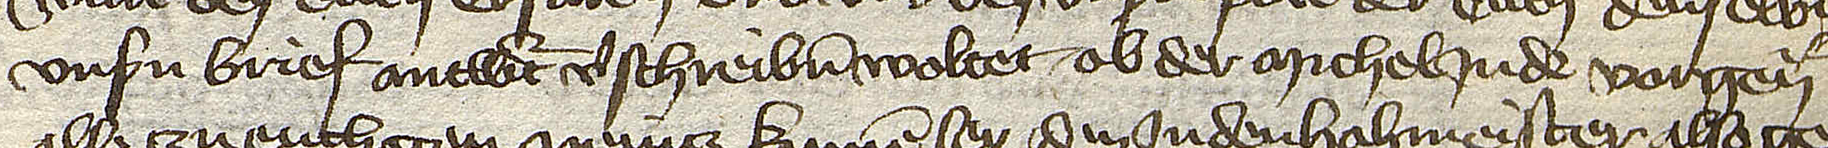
vnſ*n brief antw*t v*ſchreibn* woltet / ob der Michel Iude vorgen*
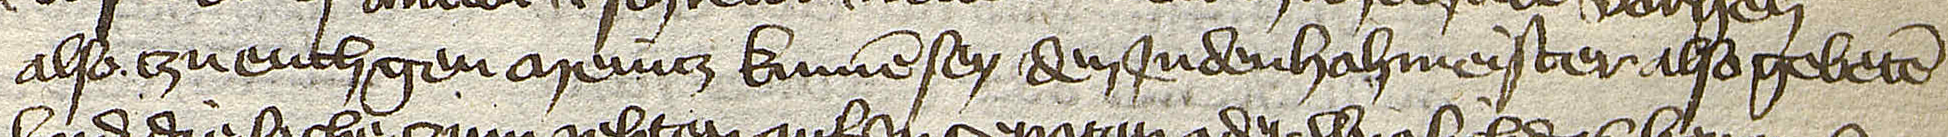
alſo cʒu euch gen Meincʒ kume* ſey / dem Iuden hohmeiſter alſo gebete*
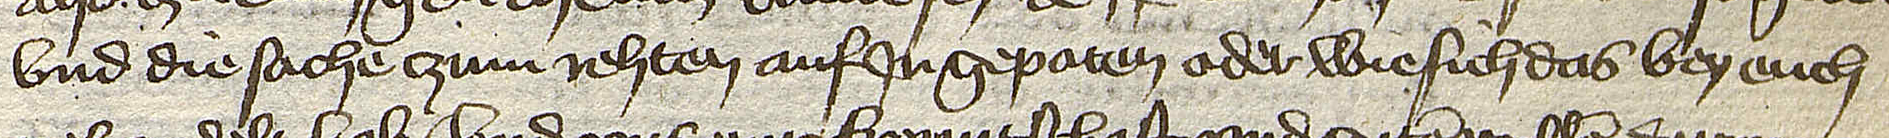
vnd die ſache cʒum rehten auf In gepoten oder wie ſich das bey euch
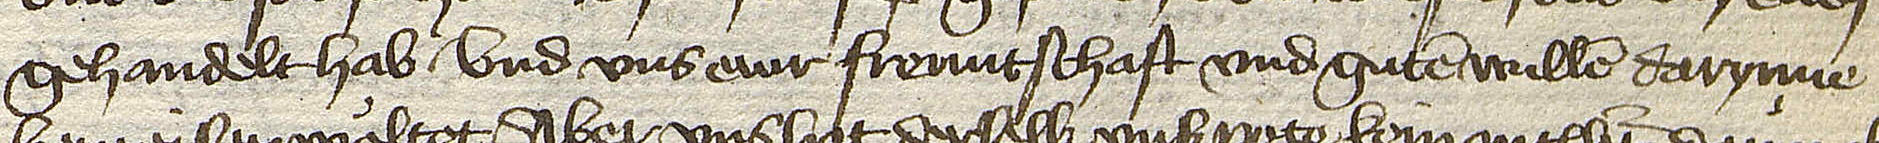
gehandelt hab / vnd vns ewr freuntſchaft vnd gute* wille* darynne
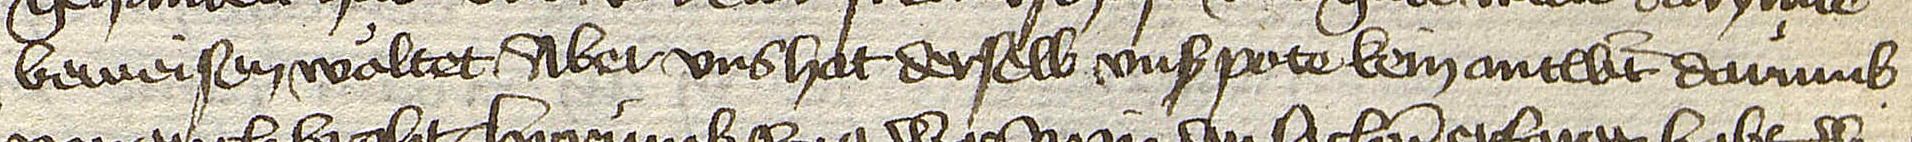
beweiſen wöltet / Aber vns hat derſelb vnſ* pote kein antw*t darümb
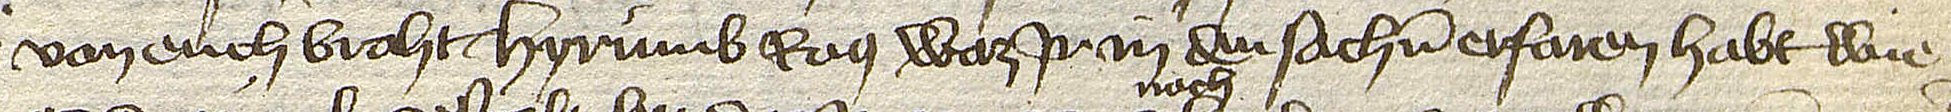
von euch braht / Hyrümb Ro* waʒ Ir in den ſachn* erfaren habt wie
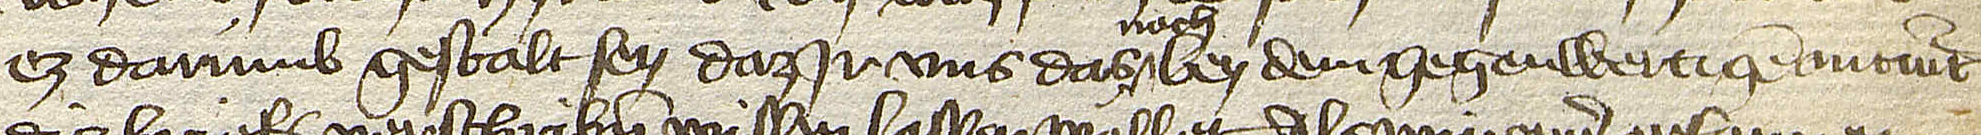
eʒ darümb geſtalt ſey daʒ Ir vns das bey dem gegenwertige* antw*t*
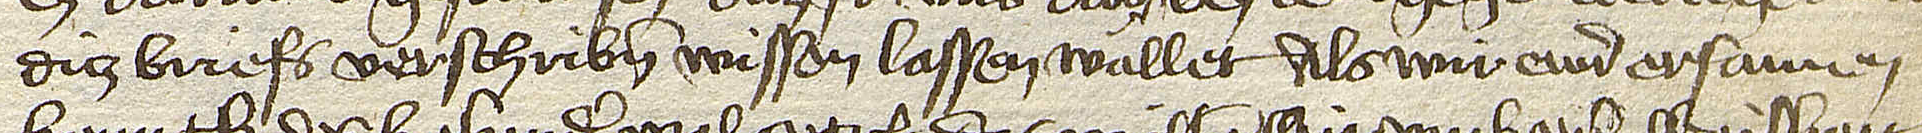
dicʒ briefs verſchribn* wiſſen laſſen wöllet Als wir ewr* erſamen
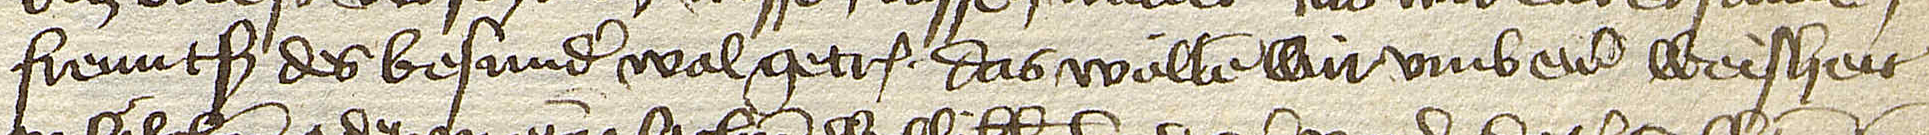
freutſ* des beſund* wol getr* . das wölle* wir vmb ew* weiſheit
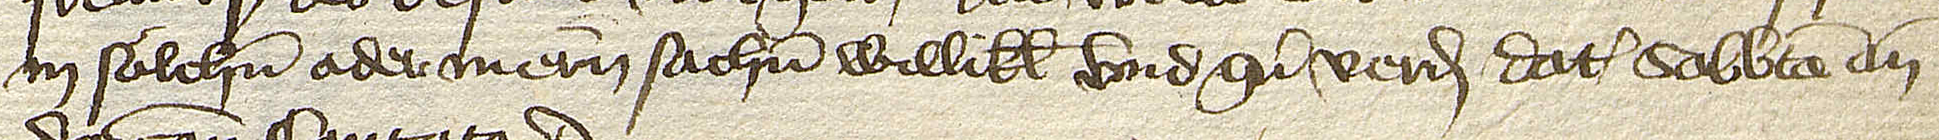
in ſölchn* oder mern* ſachn* willikl* vnd gn* verd* / dat* Sabbto* an*
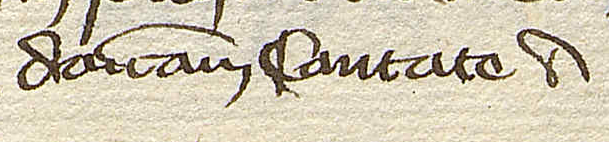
doicam* Cantate A
